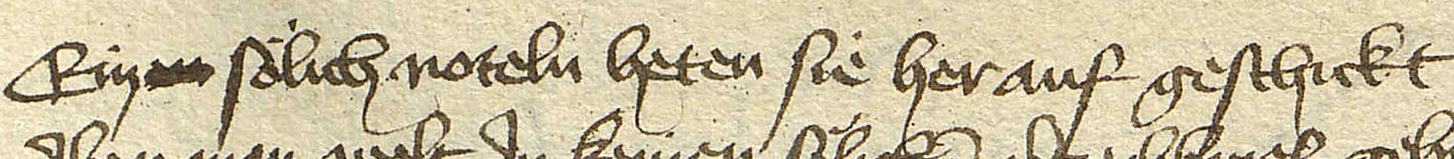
Einen ſölich noteln heten ſie herauf geſchickt
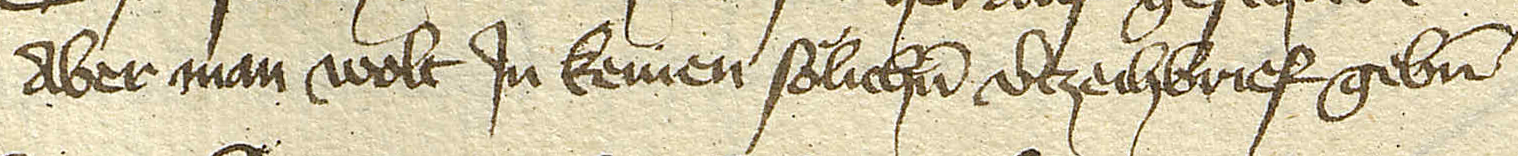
Aber man wolt In keinen ſölichn* v*cʒeihbrief gebn*
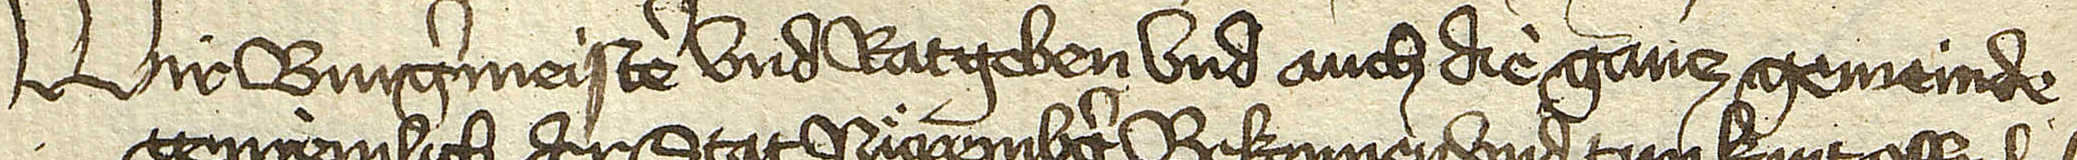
Wir Burg*meiſte* vnd Ratgeben vnd auch die gancʒ gemeinde
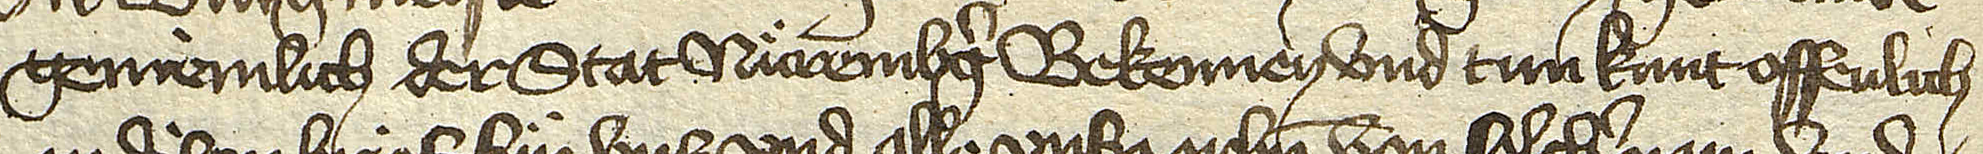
gemeinlich der Stat Nürembg* Bekennen vnd tun kunt offenlich
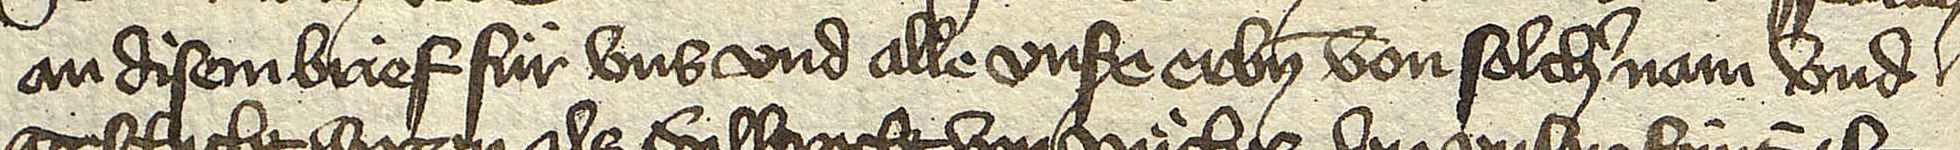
an diſem brief für vns vnd alle vnſ*e erbn* von ſolich* nam vnd /
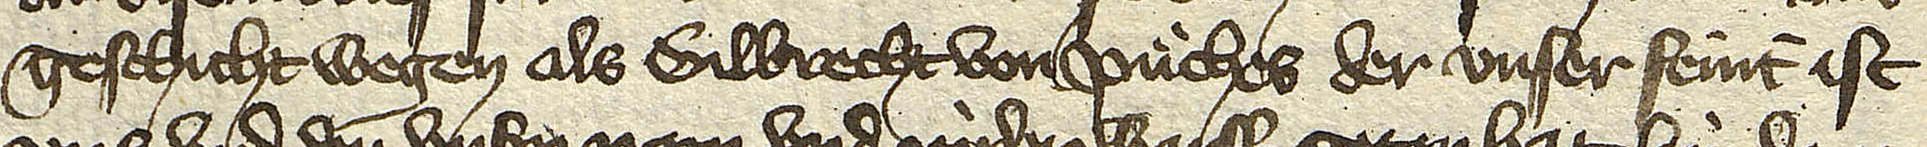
geſchicht wegen als Gilbrecht von Püches der vnſer feint iſt
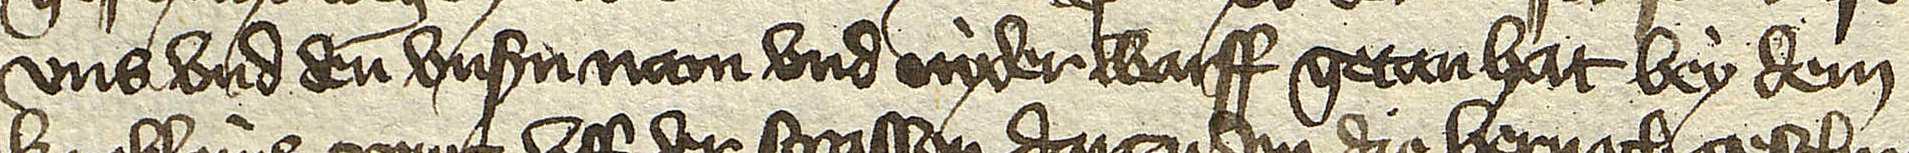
vns vnd den vnſ*n nam vnd nyder warff getan hat bey dem
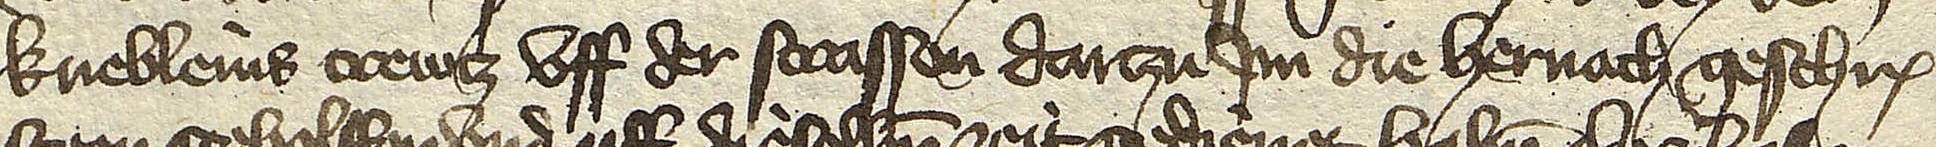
knebleins crewcʒ vff der ſtraſſen darcʒu Im die hernach geſchr*
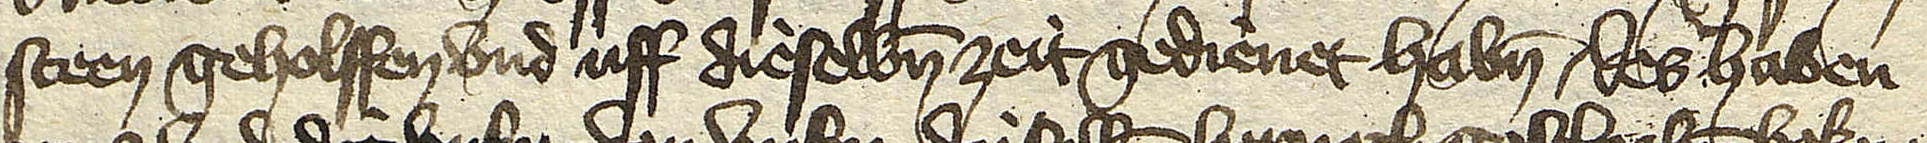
ſteen geholffen vnd uff dieſelbn* cʒeit gedienet habn* / des haben
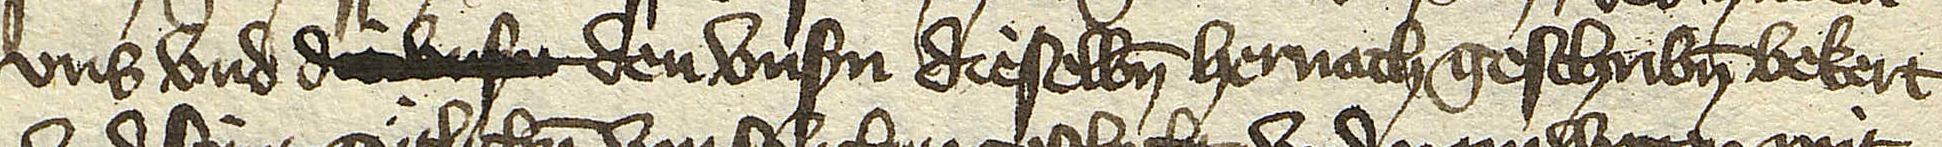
vns vnd die vnſ*n den vnſ*n dieſelbn* hernach geſchribn* bekert
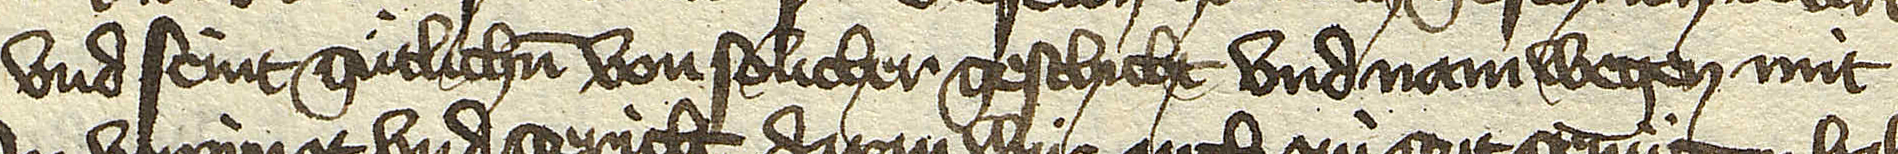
vnd ſeint gütlichn* von ſolicher geſchicht vnd nam wegen mit
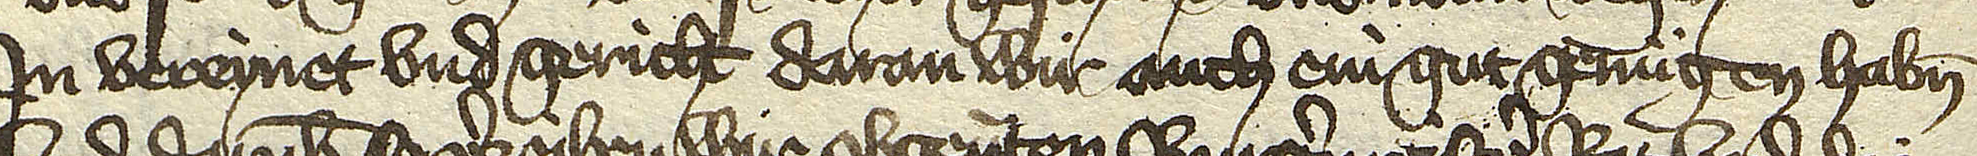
In vereynet vnd gericht daran wir auch ein gut genügen habn*
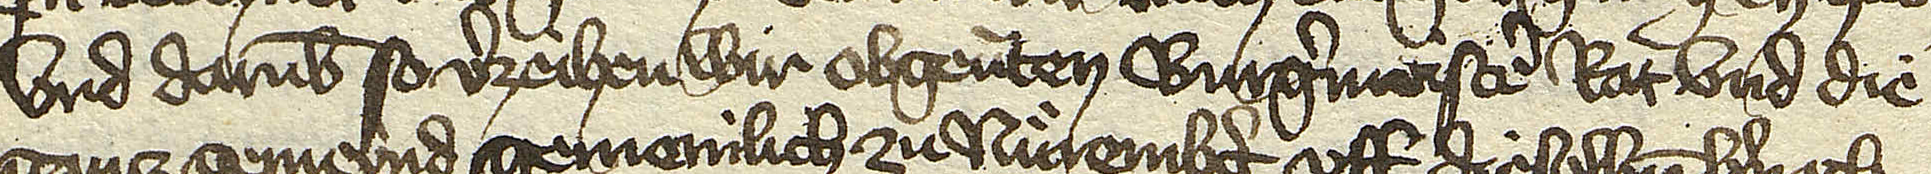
vnd darub* ſo v*cʒeihen wir obgen*ten Burg*meiſte* Rat vnd die
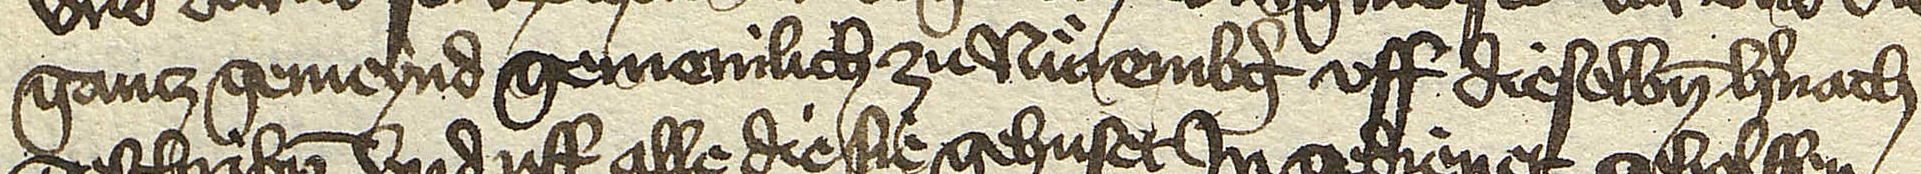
gancʒ gemeynd gemeinlich cʒu Nüremb*g vff dieſelbn* h*nach
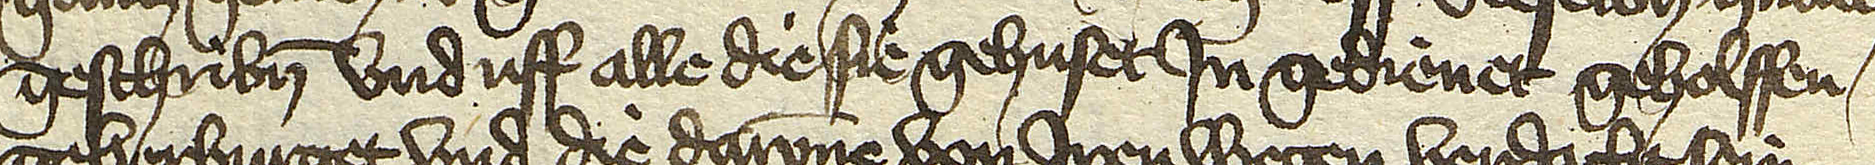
geſchribn* vnd uff alle die ſie gehuſet In gedienet geholffen
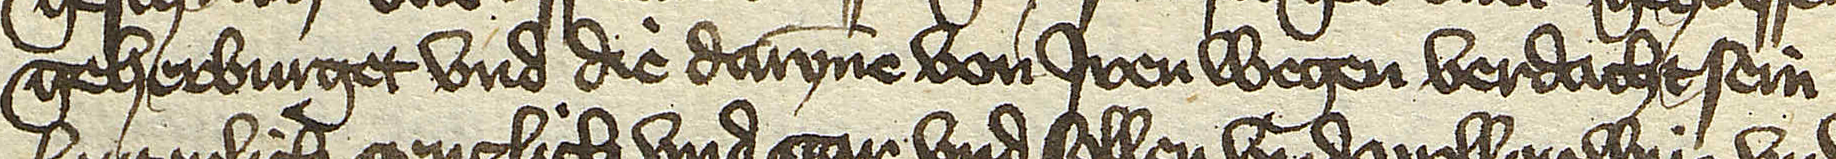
geherburget vnd die daryne* von Iren wegen verdacht ſein
